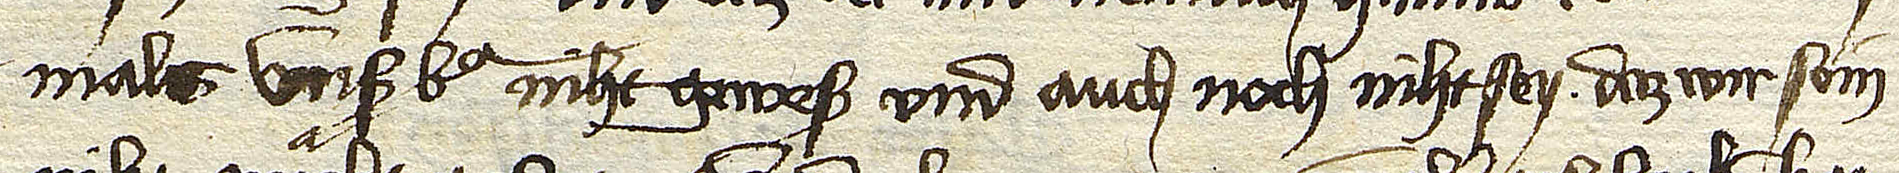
mals vnſ* b* niht geweſ* vnd auch noch niht ſey . daʒ wir ſein
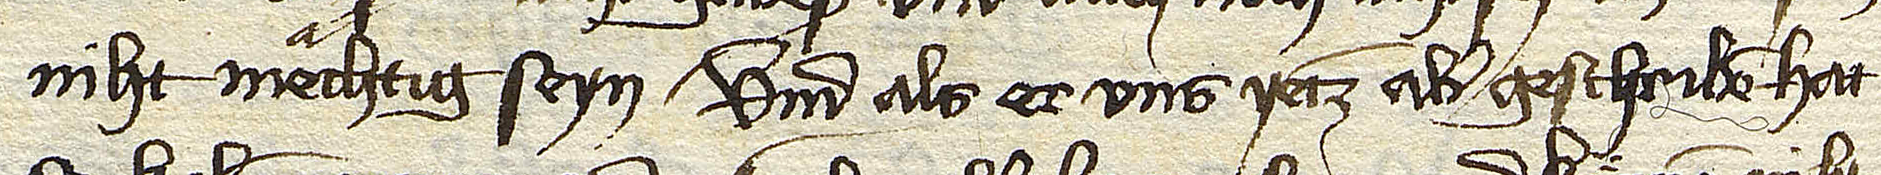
niht mëchtig ſeyn / Vnd als er vns yecʒ* ab* geſchribe* hat
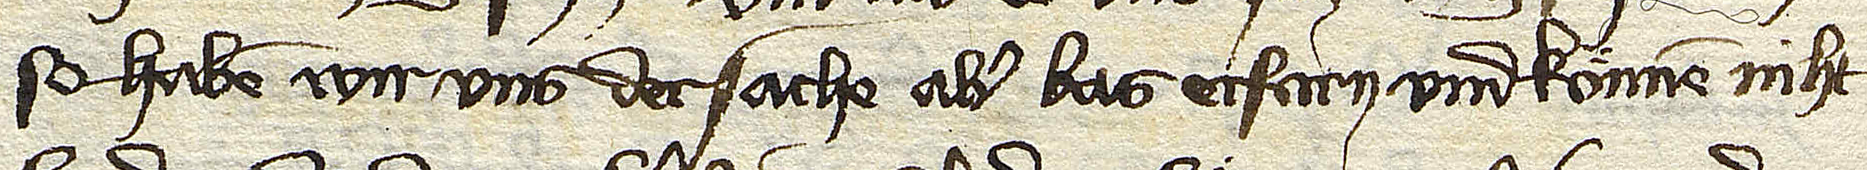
ſo habe* wir vns der ſache ab* bas erfarn vnd könne* niht
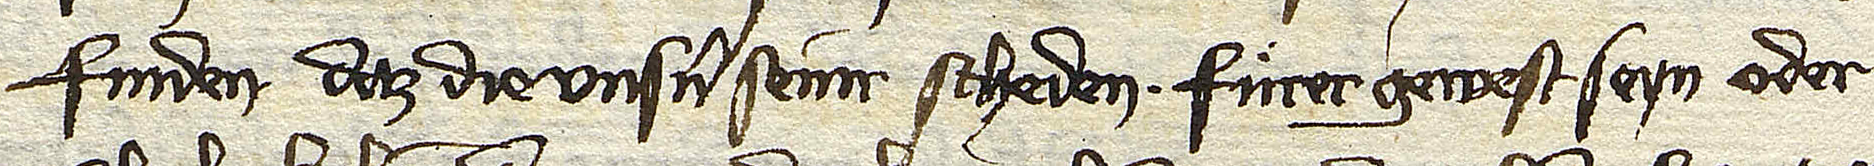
finden daʒ die vnſ*n ſeinr ſcheden . fürer geweſt ſeyn oder
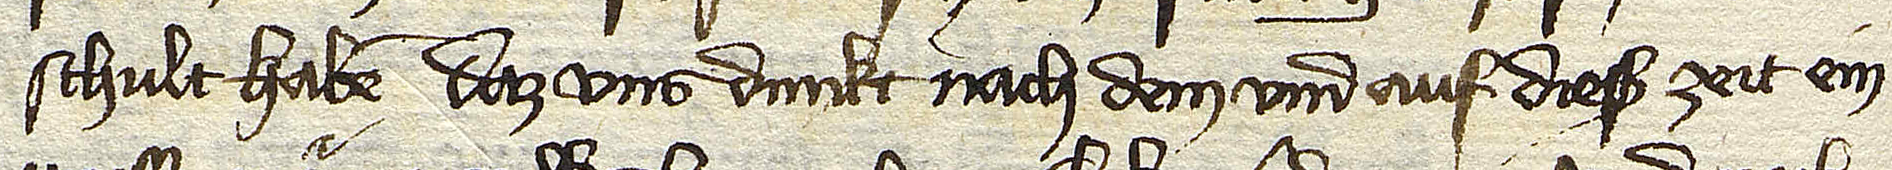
ſchult habe* daʒ vns dunkt nach dem vnd auf dieſ* ʒeit ein
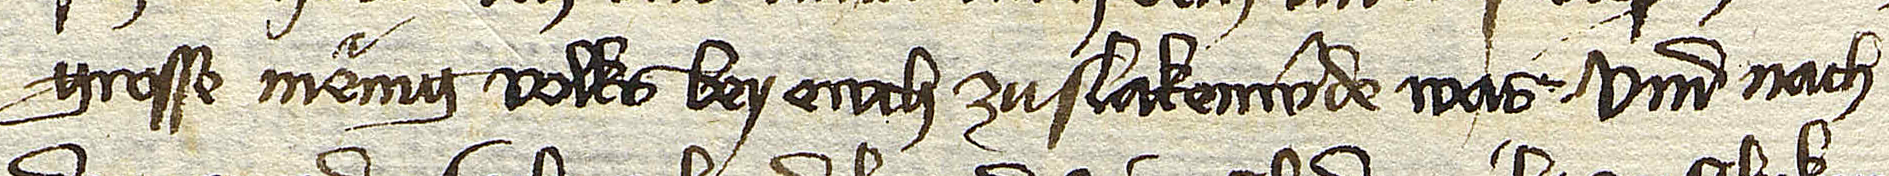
groſſe mënig volks bey ewch ʒu ſakenw*de was . vnd nach
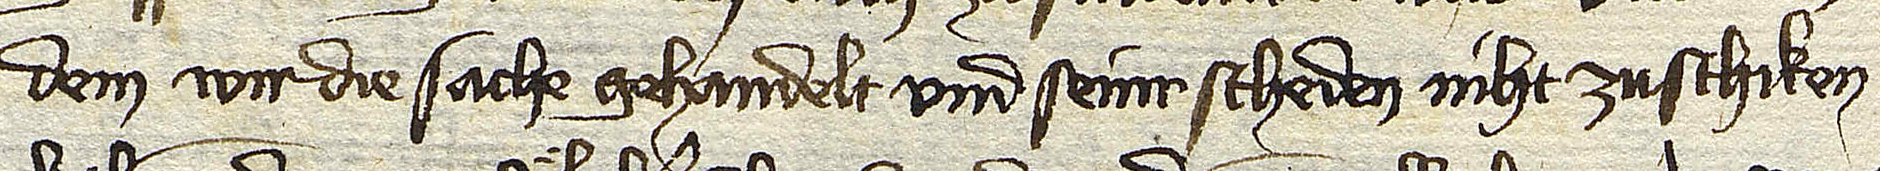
dem wir die ſache gehandelt vnd ſeinr ſcheden niht ʒuſchiken
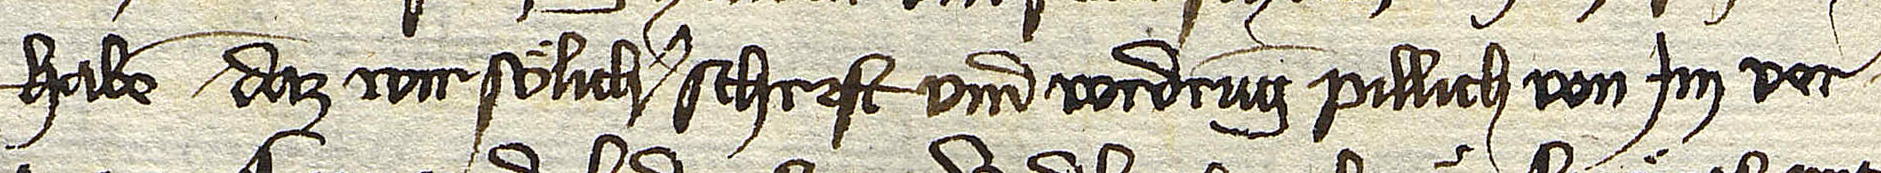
habe* / daʒ wir ſölich* ſchrift vnd vordru*g pillich von Im ver =
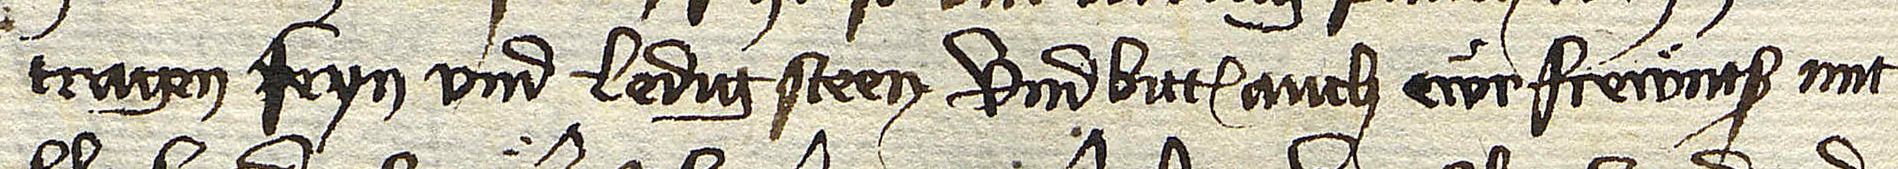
tragen ſeyn vnd ledig ſteen Vnd bitt* auch ewr frewntſ* mit
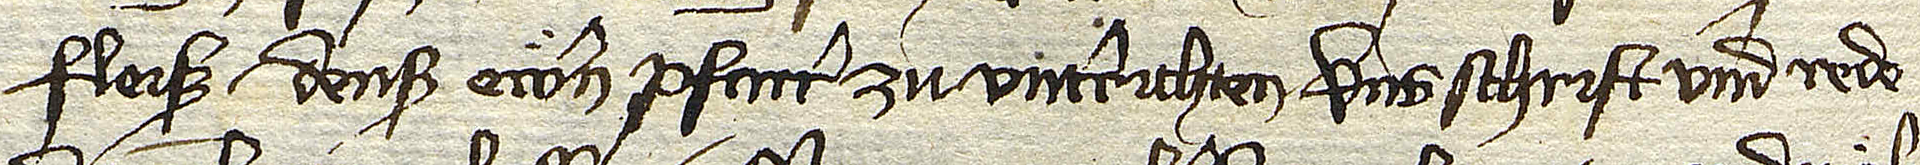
fleiſʒ / denſ* ew*n pfarr* ʒu vnt*richten Vns ſchrift vnd rede
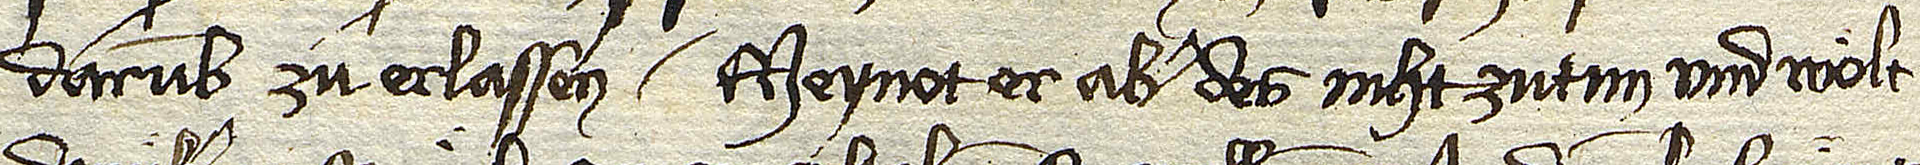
daru*b ʒu erlaſſen / Meynet er ab* des niht ʒutun vnd wölt
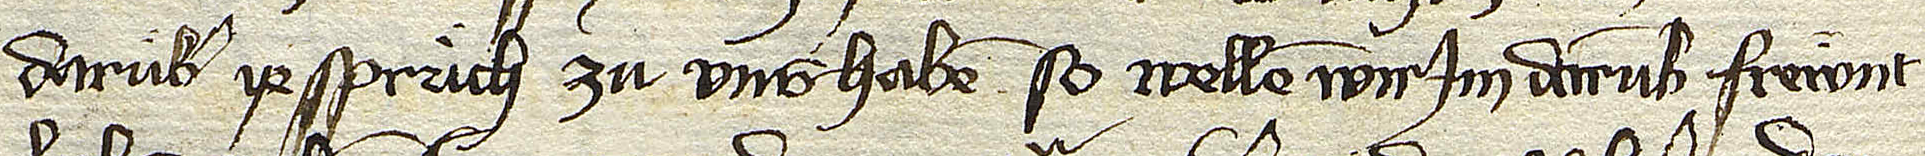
darüb* ye ſprüch ʒu vns habe* . ſo welle* wir Im daru*b frewnt
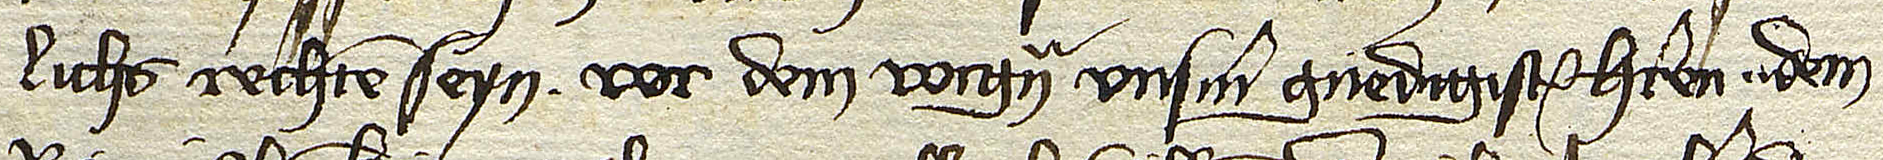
lichs rechte* ſeyn . vor dem vorgn* vnſ*m gnedigiſt* h*ren ~ dem
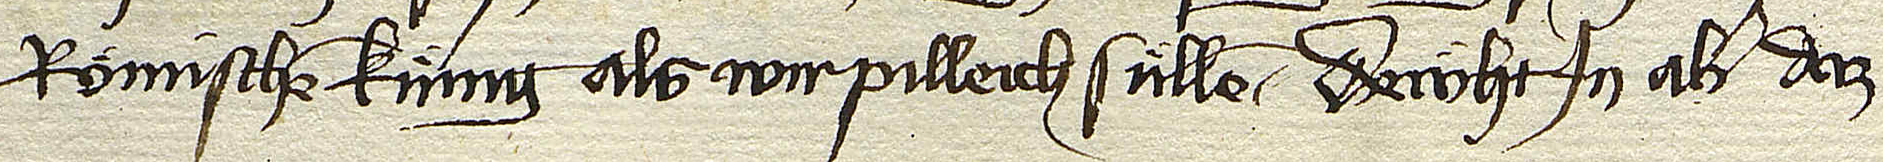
Römiſche* künig als wir pilleich ſülle* / Dewcht In ab* daʒ
